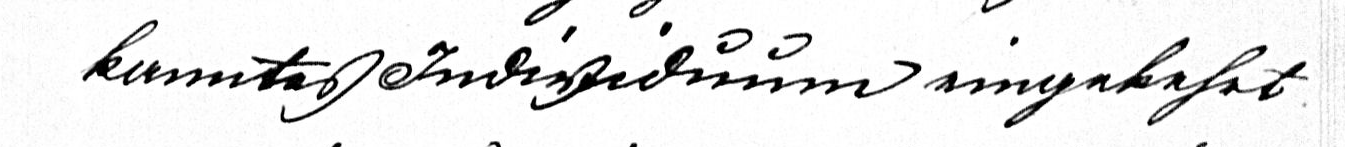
kanntes Individuum eingekehrt
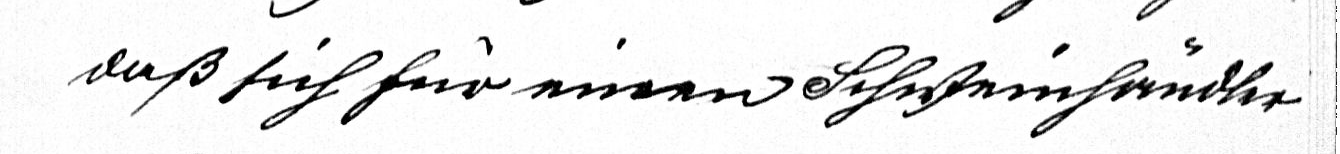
daß sich für einen Schweinhändler
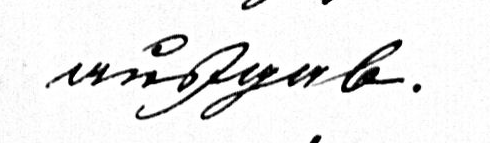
ausgab.
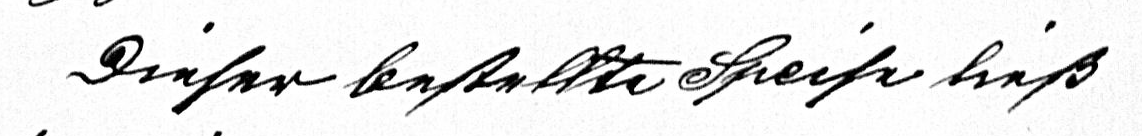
Dieser bestellte Speise ließ
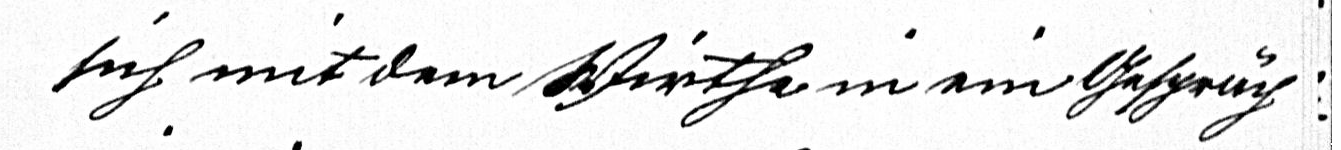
sich mit dem Wirthe in ein Gespräch
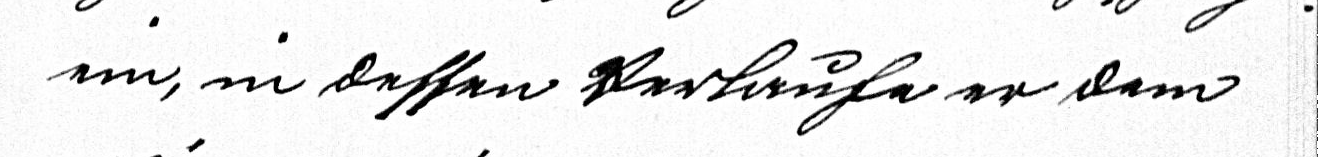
ein, in dessen Verlaufe er dem
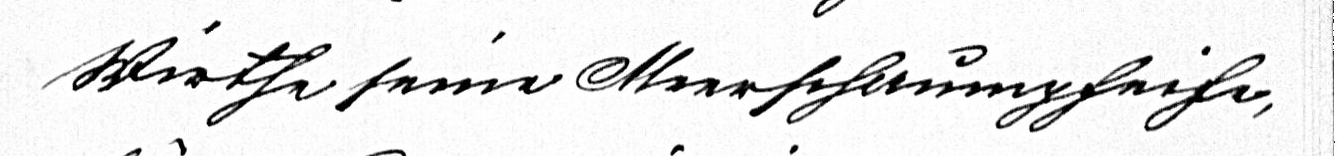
Wirthe seine Meerschaumpfeife,
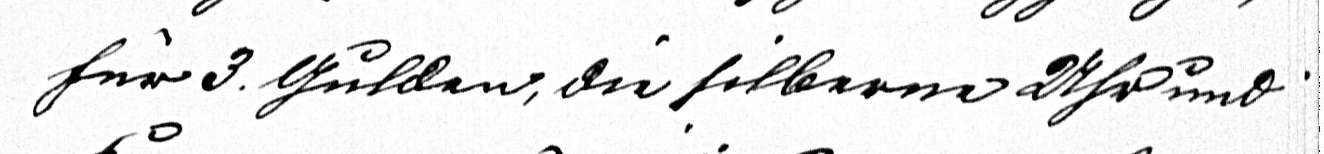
für 3. Gulden, die silberne Uhr und
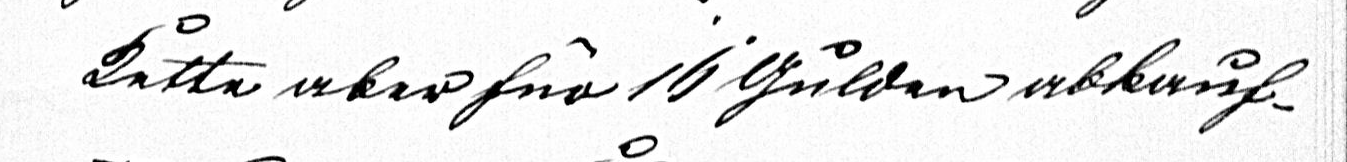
Kette aber für 16 Gulden abkaufte,
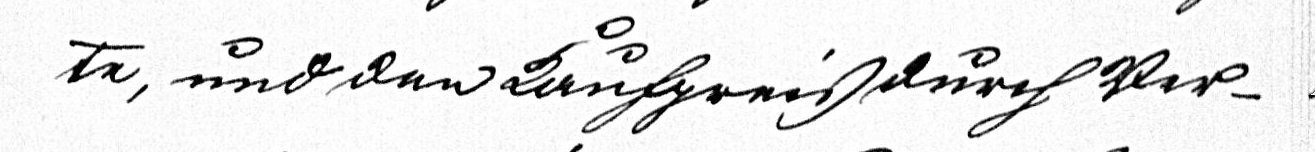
und den Kaufpreis durch Ver¬
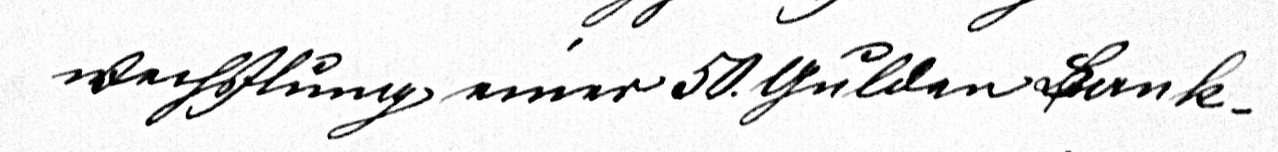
wechslung, einer 50. Gulden Bank¬
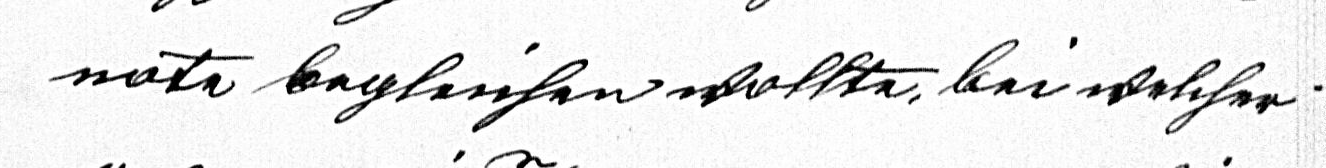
note begleichen wollte, bei welcher
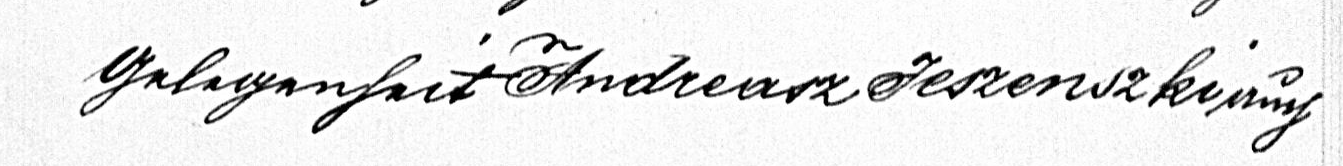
Gelegenheit Andreasz Jeszenszki auch
